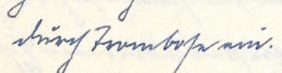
durch Thrombose ein.
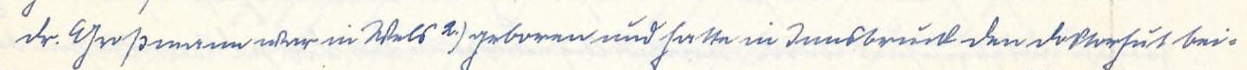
Dr. Großmann war in Wels 2) geboren und hat in Innsbruck den Doktorhut bei-
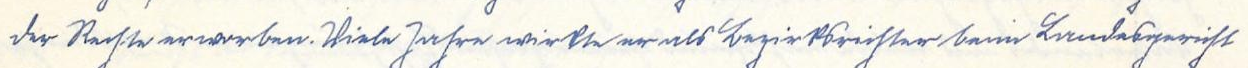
der Rechte erworben. Viele Jahre wirkte er als Bezirksrichter beim Landesgericht
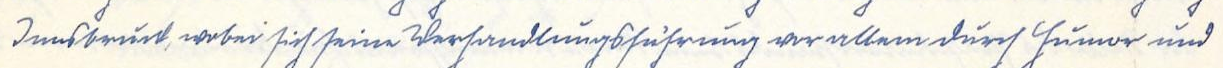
Innsbruck wobei sich seine Verhandlungsführung vor allem durch Humor und
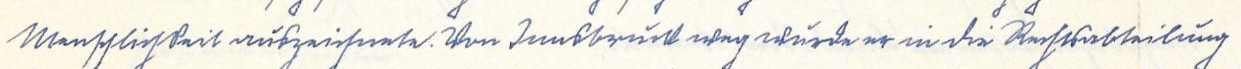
Menschlichkeit auszeichnete. Von Innsbruck weg wurde er in die Rechtsabteilung
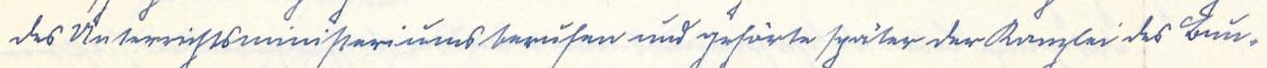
des Unterrichtsministeriums berufen und gehörte später der Kanzlei des Bun-
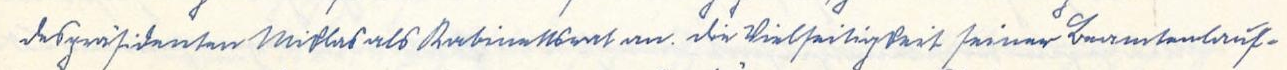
despräsidenten Miklas als Kabinettsrat an. Die Vielseitigkeit seiner Beamtenlauf-
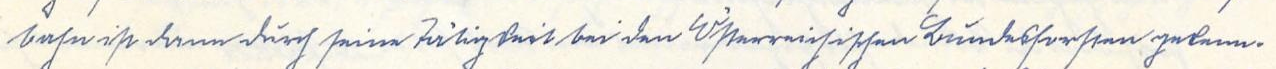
bahn ist dann nur durch seine Tätigkeit bei den Österreichischen Bundesforsten gekenn-
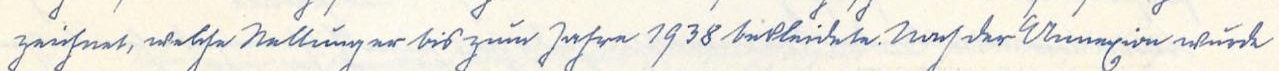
zeichnet, welche Stellung der bis zum Jahr 1938 bekleidete. Nach der Annexion wurde
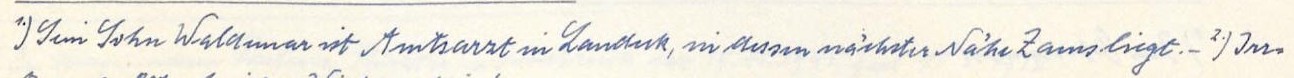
1) Sein Sohn Waldemar ist Amtsarzt in Landeck, in dessen nächster Nähe Zams liegt. – 2) Irr
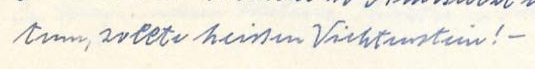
tum, sollte heißen Vichtenstein!-
